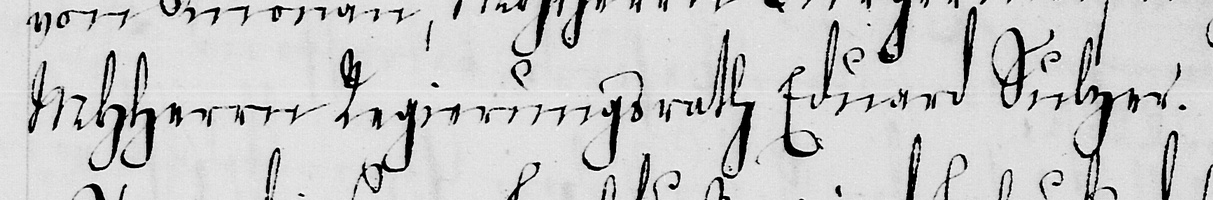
MHHerrn Regierungsrath Eduard Sulzer.
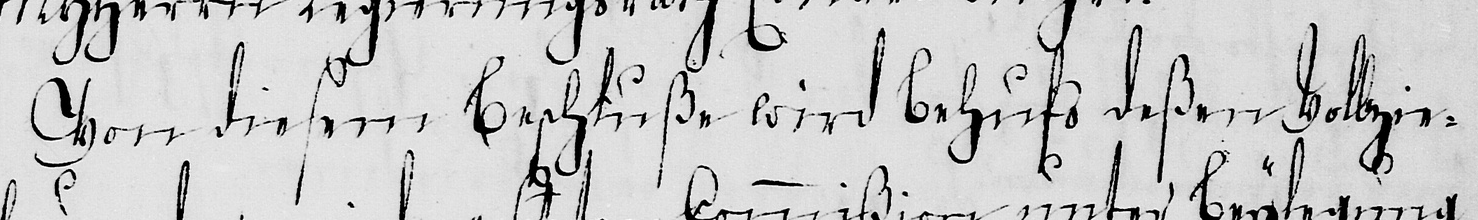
Von diesem Beschluße wird Behufs deßen Vollzie¬
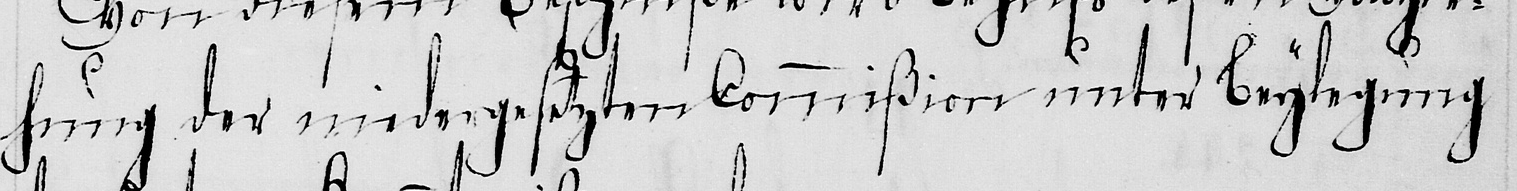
hung der niedergesetzten Commißion unter Beylegung
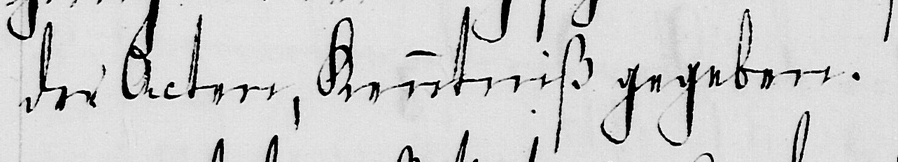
der Acten, Kenntniß gegeben.
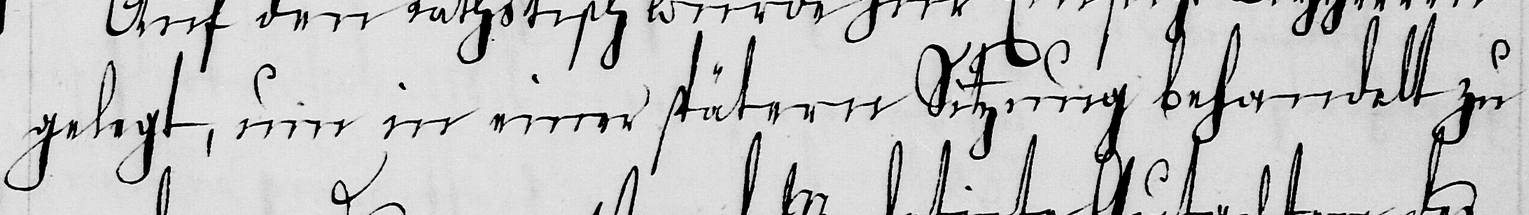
gelegt, um in einer spätern Sitzung behandelt zu
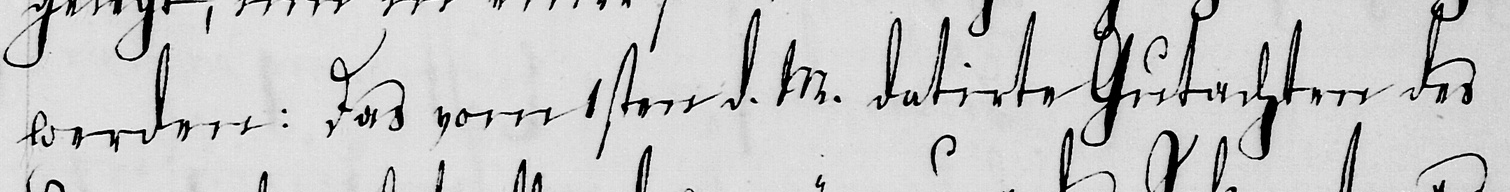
werden: Das vom 1sten d. M. datirte Gutachten des
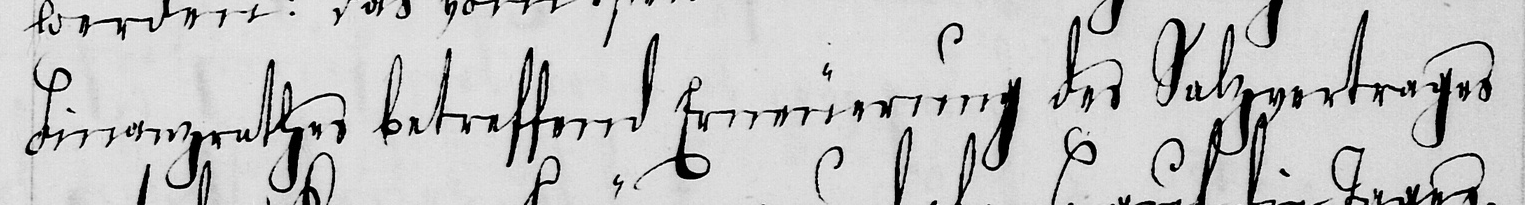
Finanzrathes betreffend Erneuerung des Salzvertrages
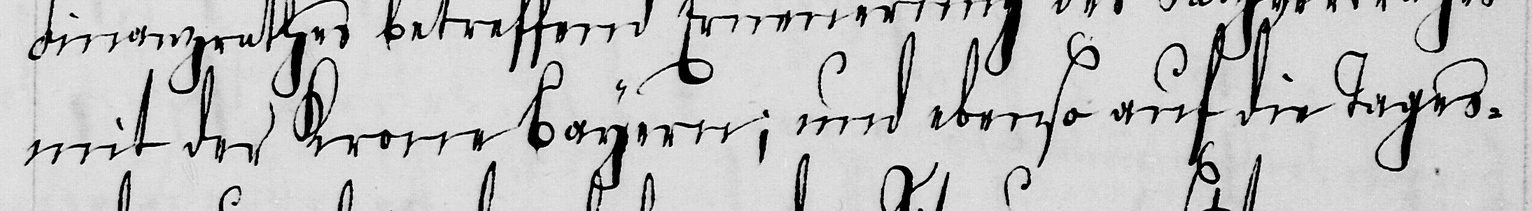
mit der Krone Bayern; und ebenso auf die Tages¬
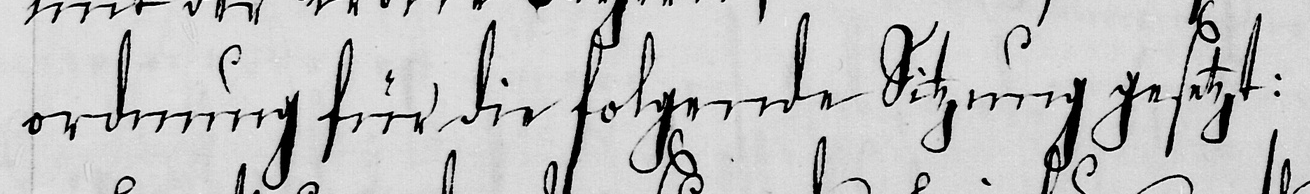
ordnung für die folgende Sitzung gesetzt:
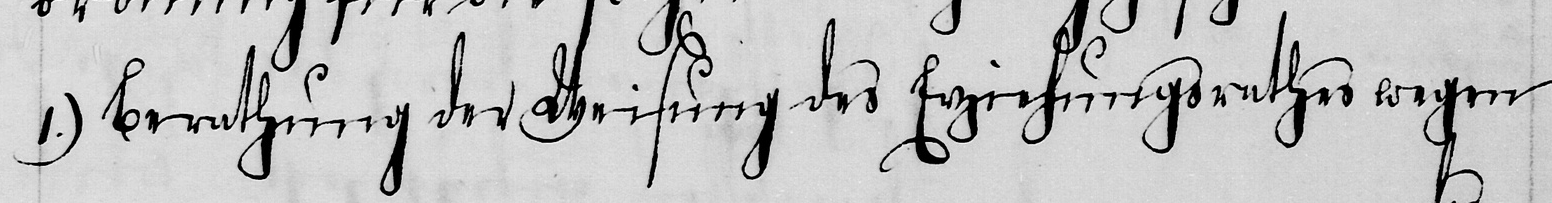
1.) Berathung der Weisung des Erziehungsrathes wegen
